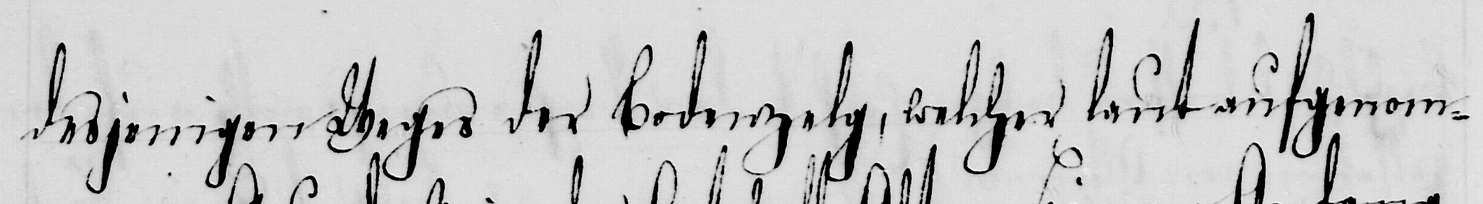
desjenigen Weges der Bodenzelg, welcher laut aufgenom¬
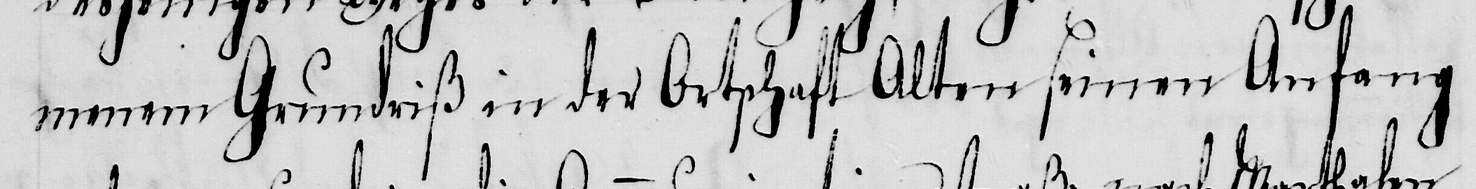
menem Grundriß in der Ortschaft Alten seinen Anfang
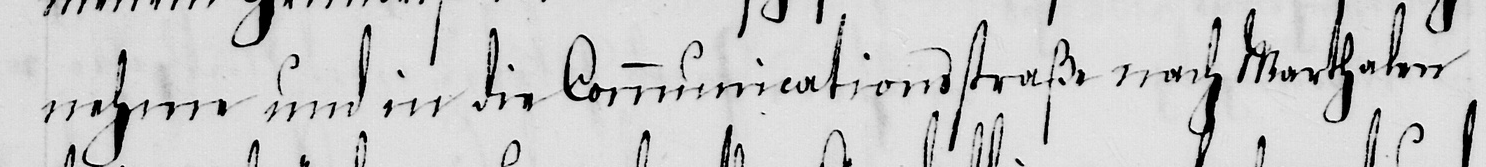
nehme und in die Communicationsstraße nach Marthalen
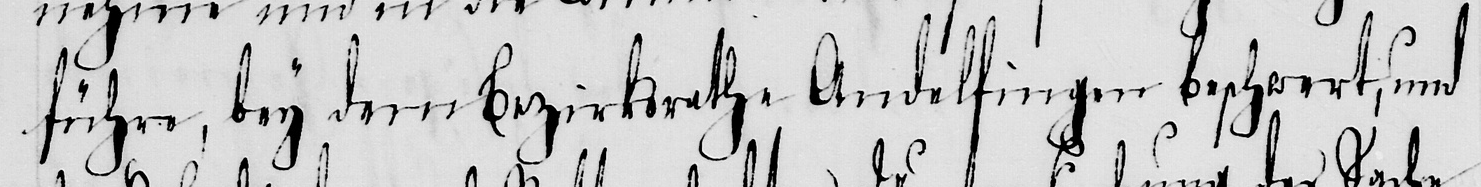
führe, bey dem Bezirksrathe Andelfingen beschwert, und
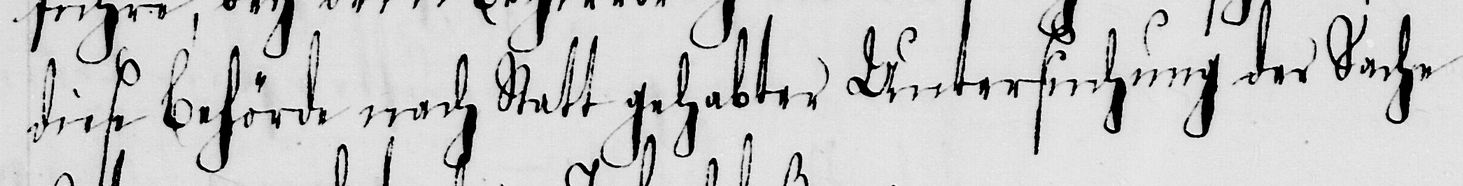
diese Behörde nach Statt gehabter Untersuchung der Sache
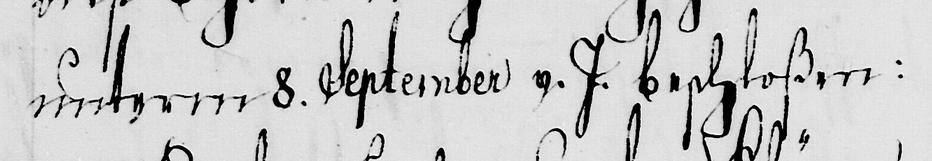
unterm 8. September v. J. beschloßen:
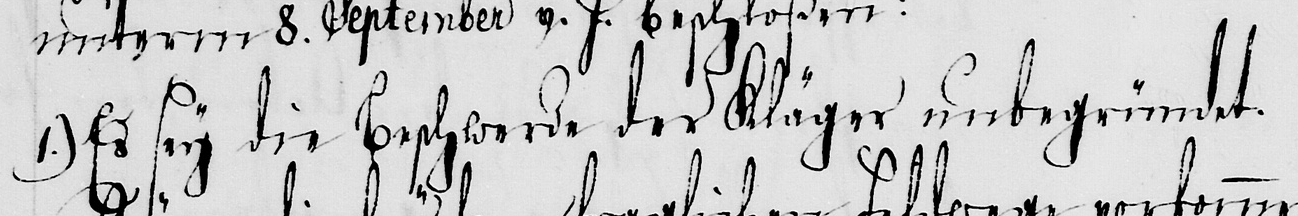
Es sey die Beschwerde der Kläger unbegründet.
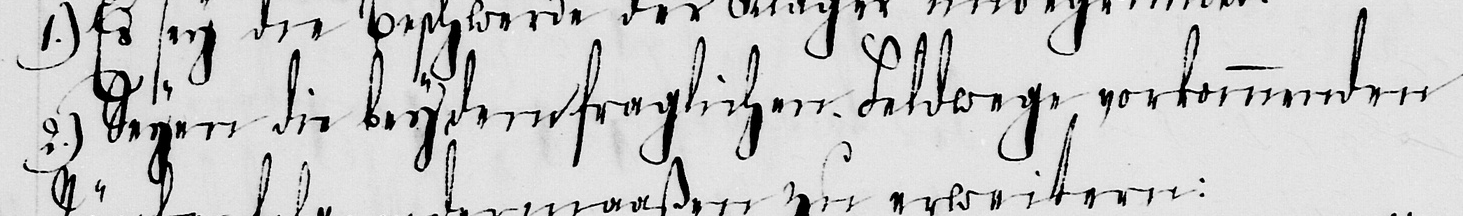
2.) Seyen die bey dem fraglichen Feldwege vorkommenden
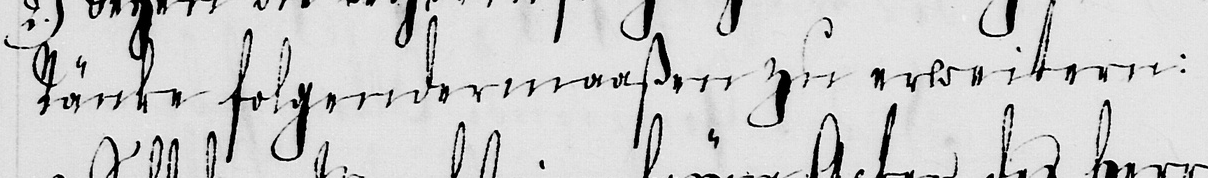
Ränke folgendermaßen zu erweitern:
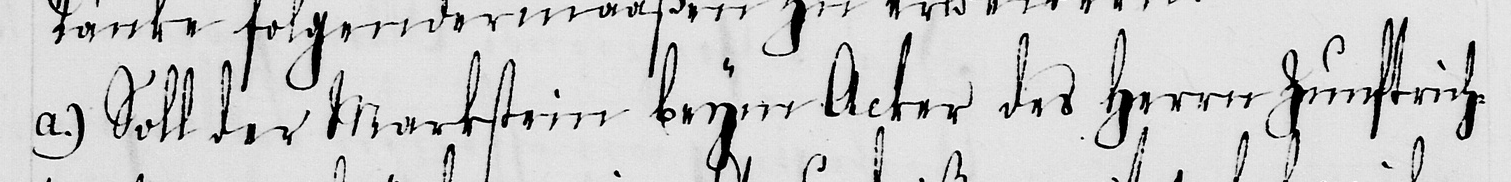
a.) Soll der Markstein beym Acker des Herrn Zunftrich¬
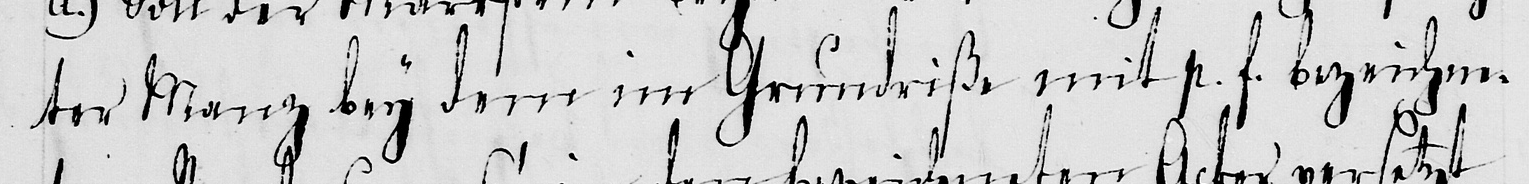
ter Manz bey dem im Grundriße mit p. f. bezeichne¬
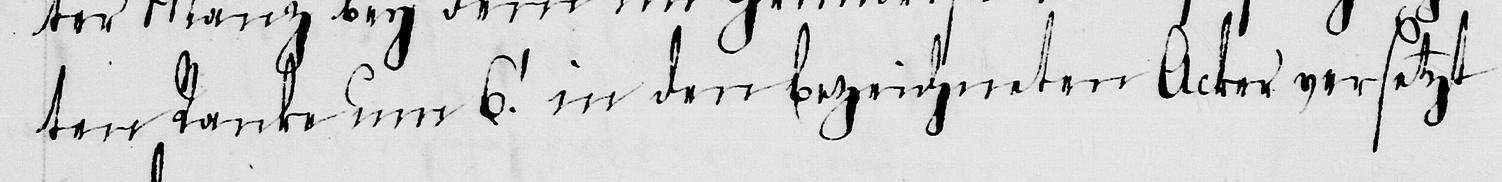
ten Ranke um 6 [Fuss]. in den bezeichneten Acker versetzt
